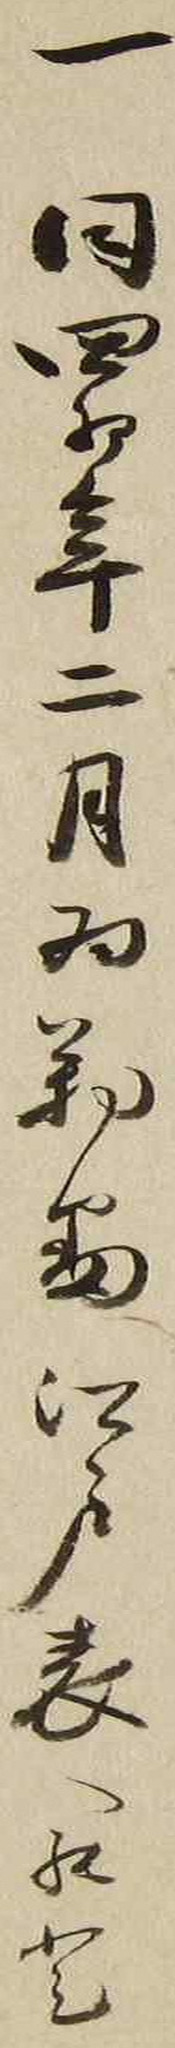一同四卯年二月初勤番江戸表へ罷登
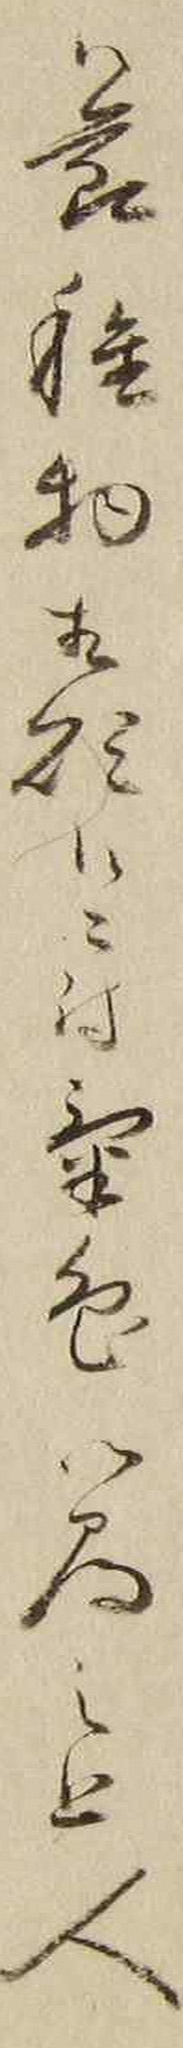候節腫物相煩候に付気色御尋之上人
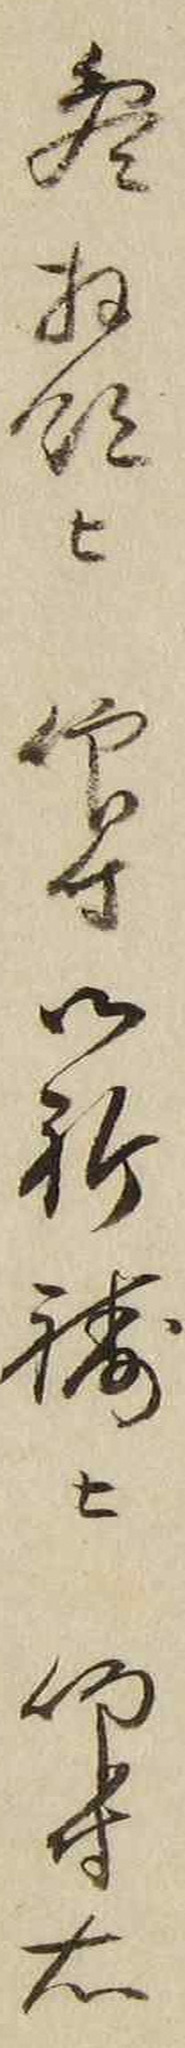参拝領被仰付御祈祷被仰付右
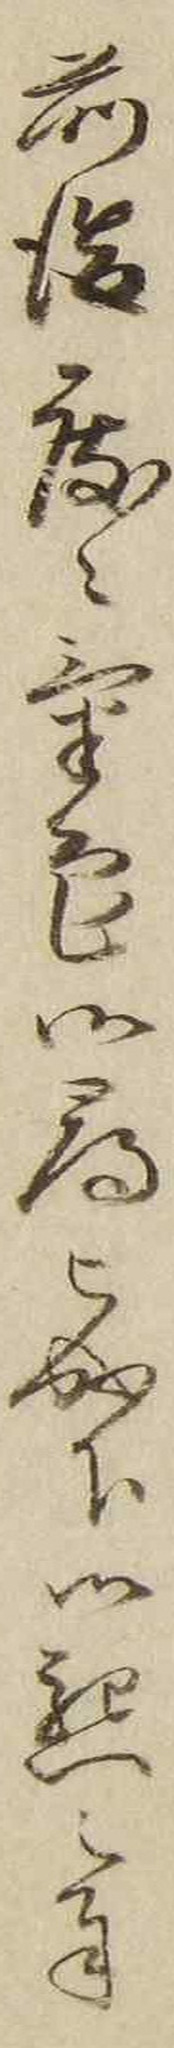前後度々気色御尋被成下御懇之奉

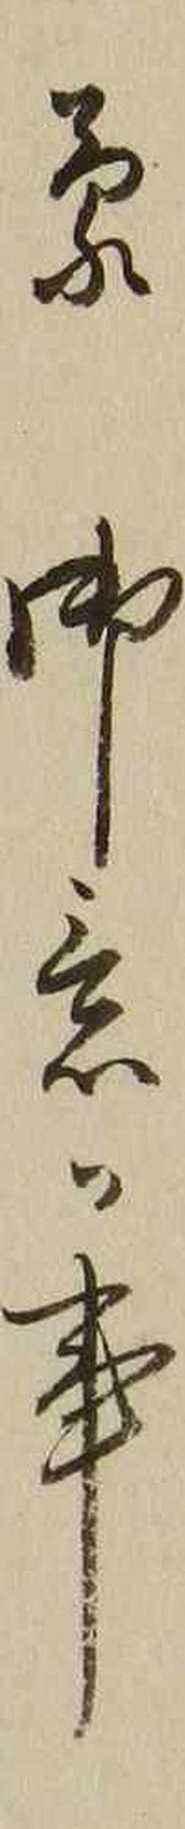蒙御意候事
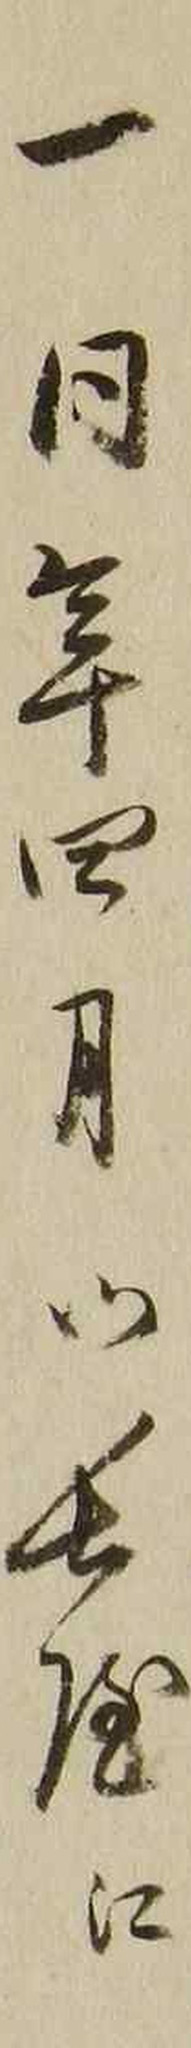一同年四月御長屋江
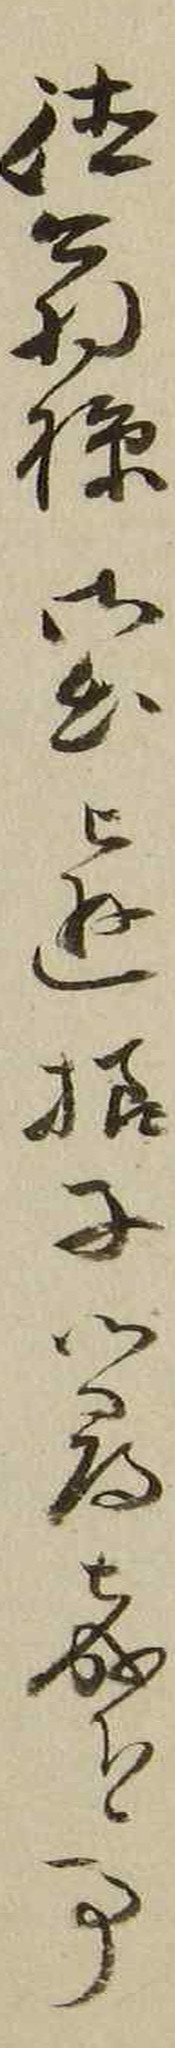徳翁様御出被遊様子御尋被成下候事
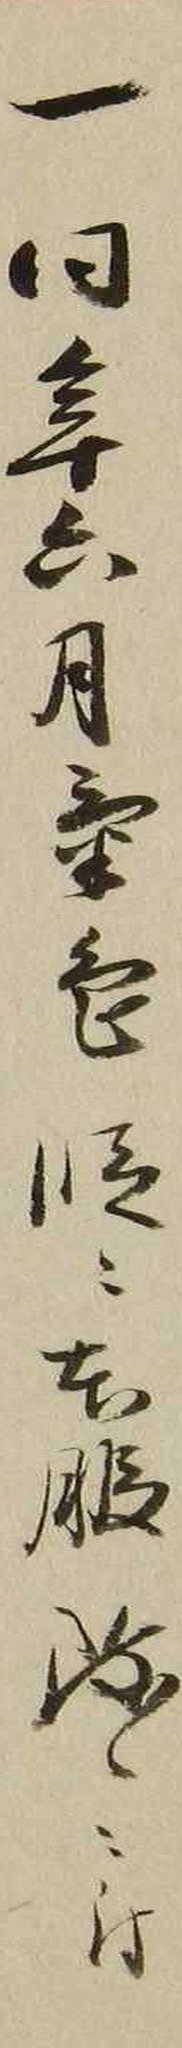一同年六月気色段々本服致候に付
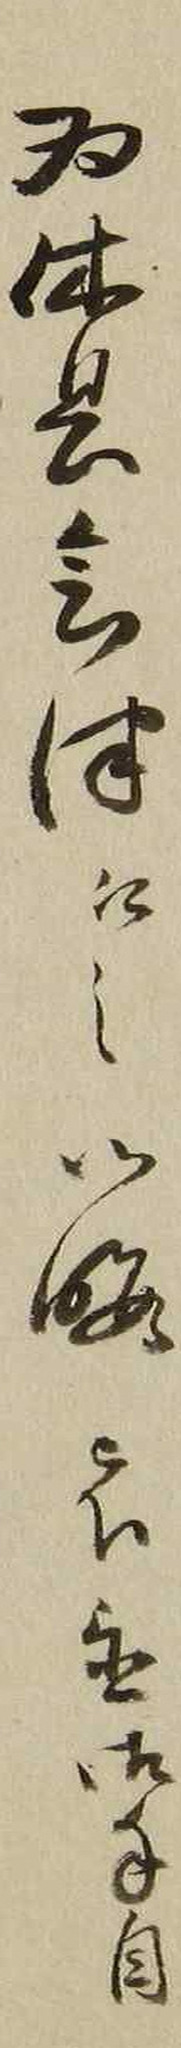為休息会津江之御暇被下置手自
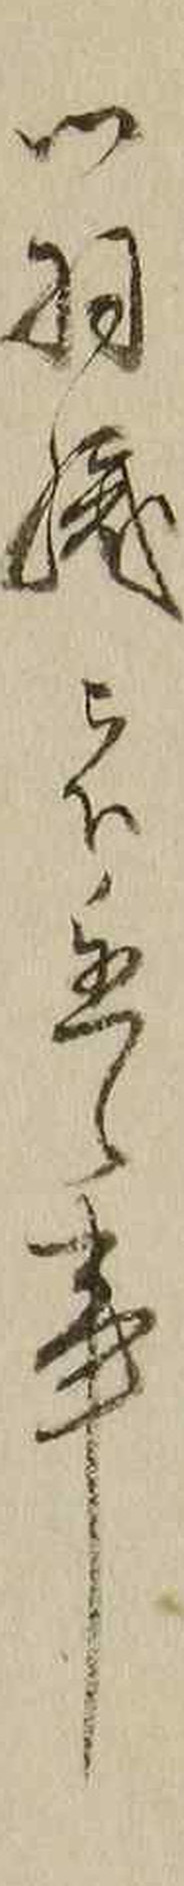御羽織被下置候事
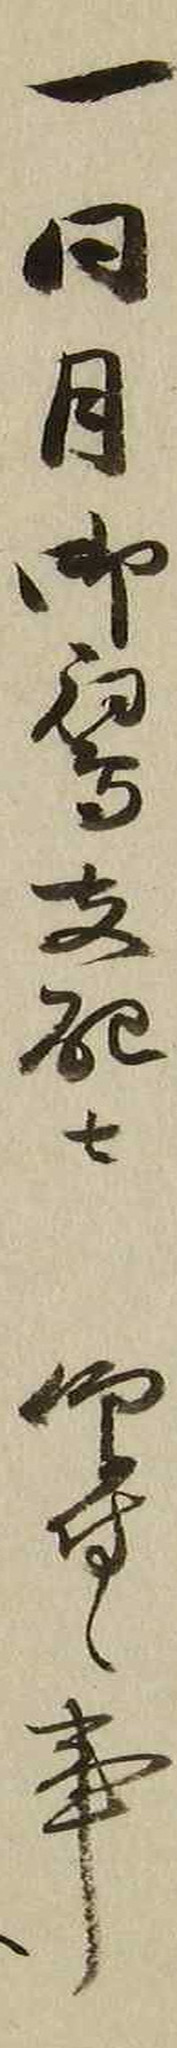一同月御鷹支配被仰付候事
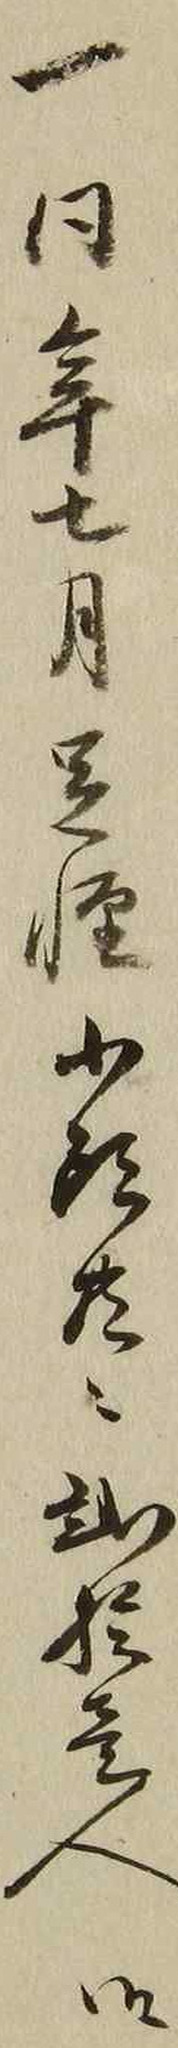一同年七月足軽小頭共に弐拾壱人御
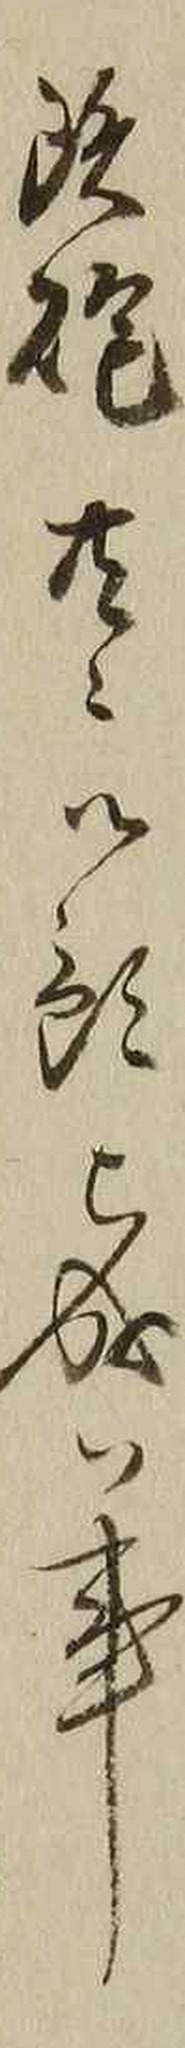鉄砲共に御預被成候事
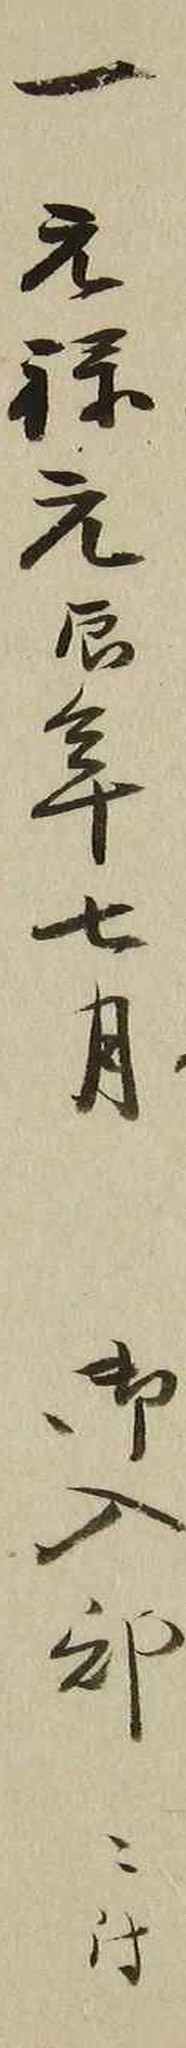一元禄元辰年七月御入部に付
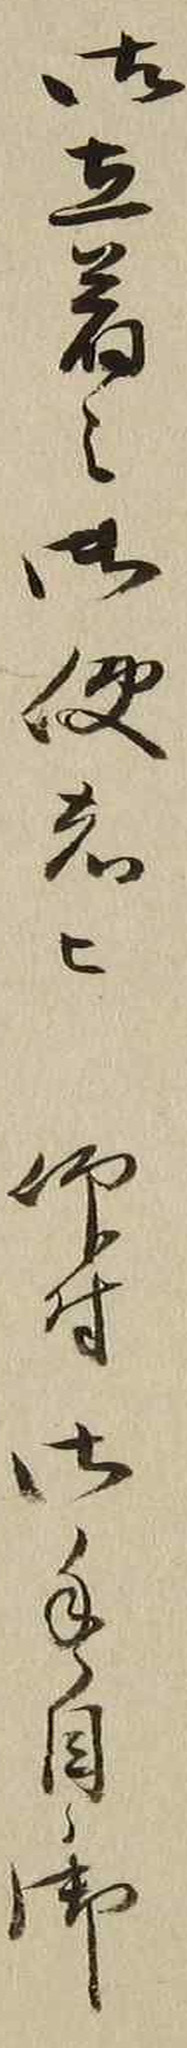御在着之御使者被仰付御手自御
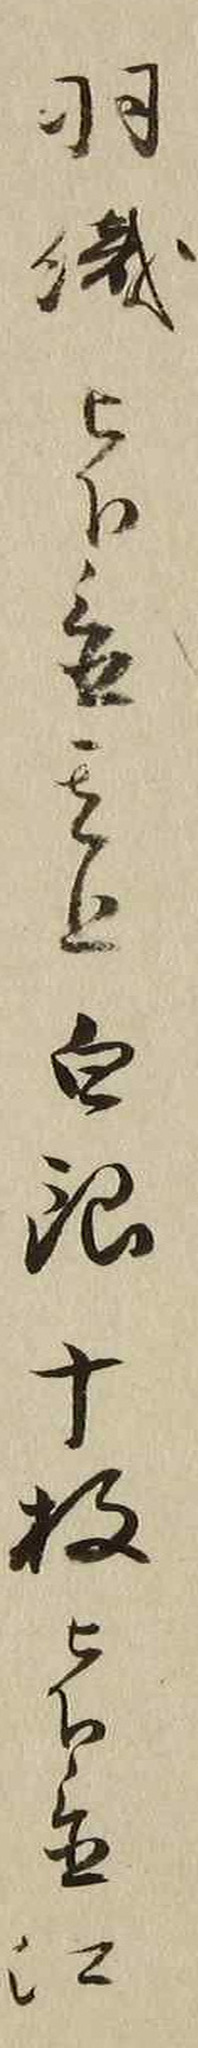羽織被下置其上白銀十枚被下置え江
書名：諸士系譜　巻之269　さ之部1
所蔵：会津若松市立会津図書館
